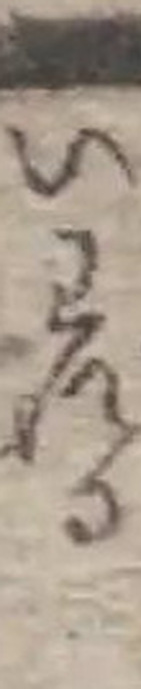いわれる
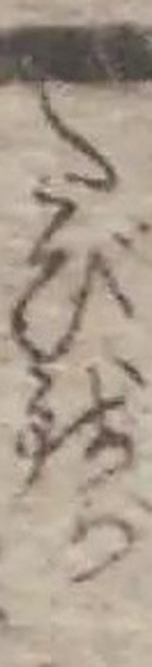たび残が

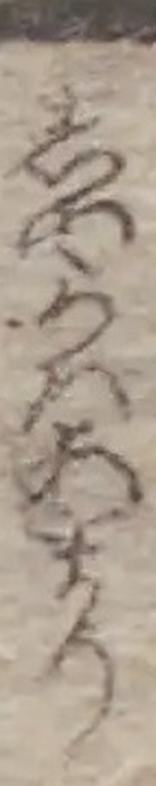しやかはあまり
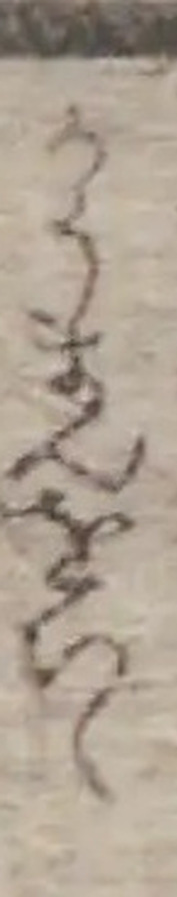かうまんをいゝ
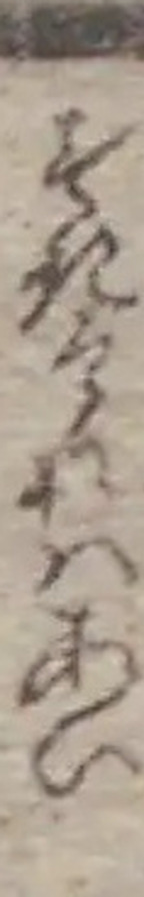すきけれはあい
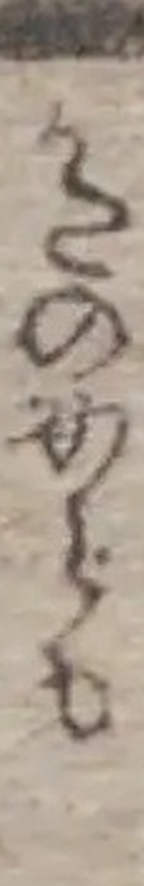かたの女郎も
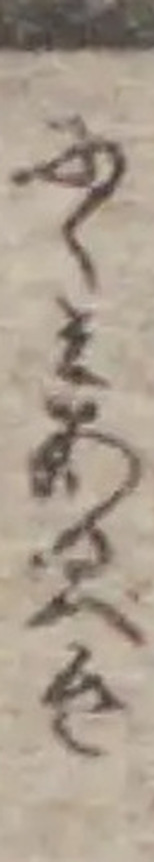にくみあるべき
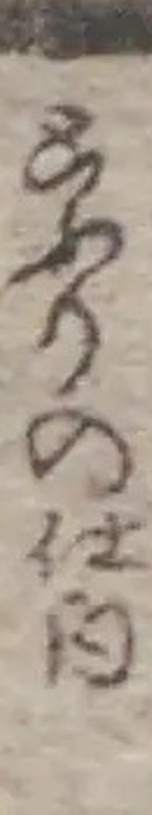とふりの仕内
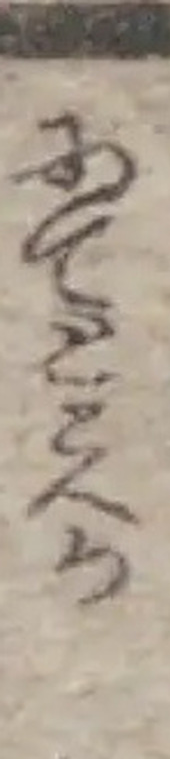にてとこへは
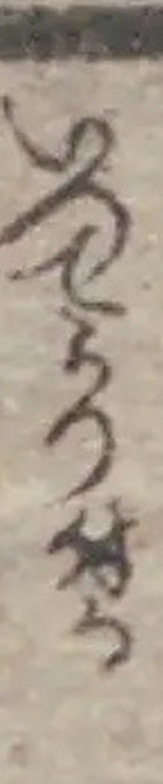いつてより付か
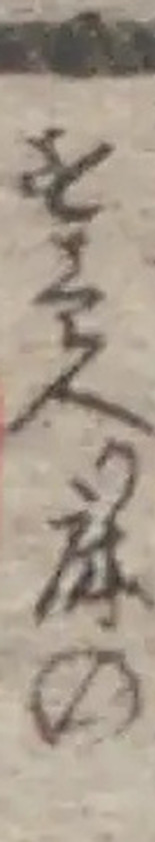す壱人り床の
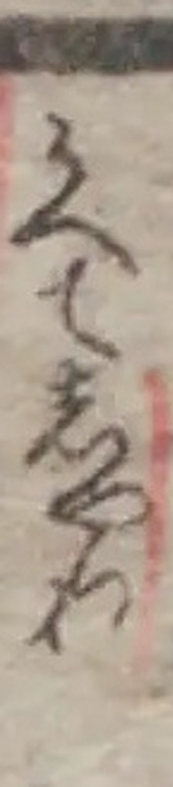うへてしやれ
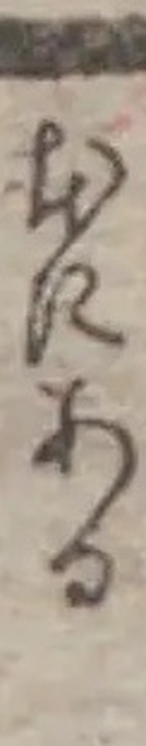本にある
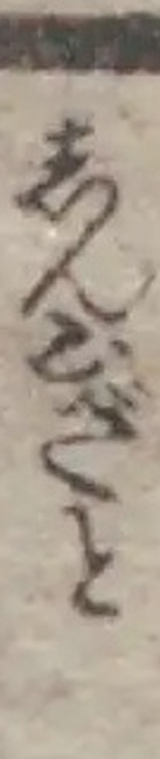しんこざと
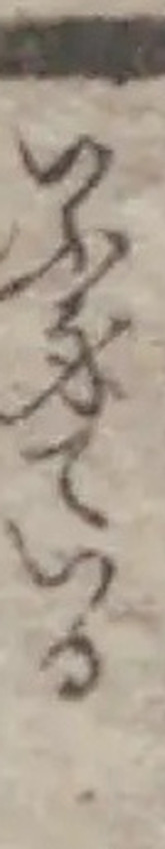いふ身ている
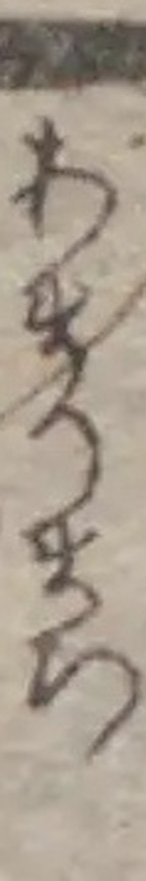あまりまち
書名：早出来 3巻
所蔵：国立国会図書館 National Diet Library, JAPAN
